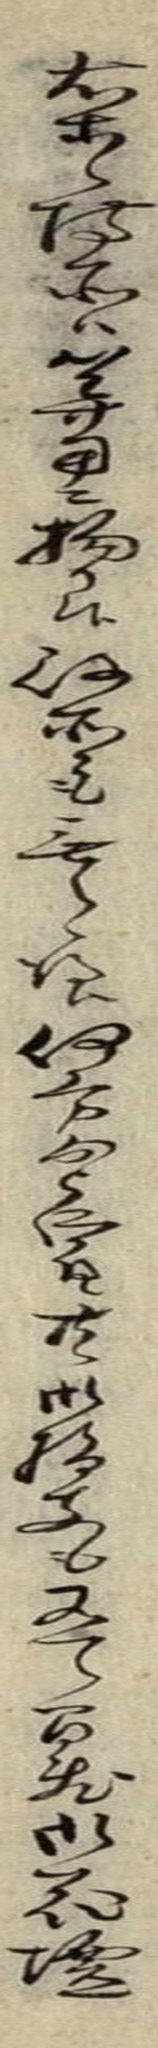右等之場所は算用に拘り候役所にも無之候得は何方ゟ被仰付候共御指支も有之間敷御花壇
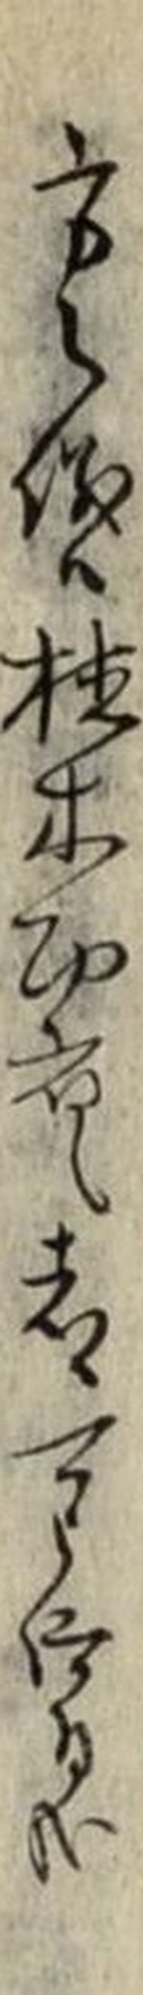方之儀は植木功者之者へ可被仰付候哉
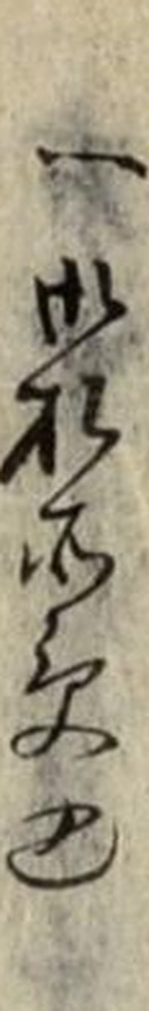一御札所受込
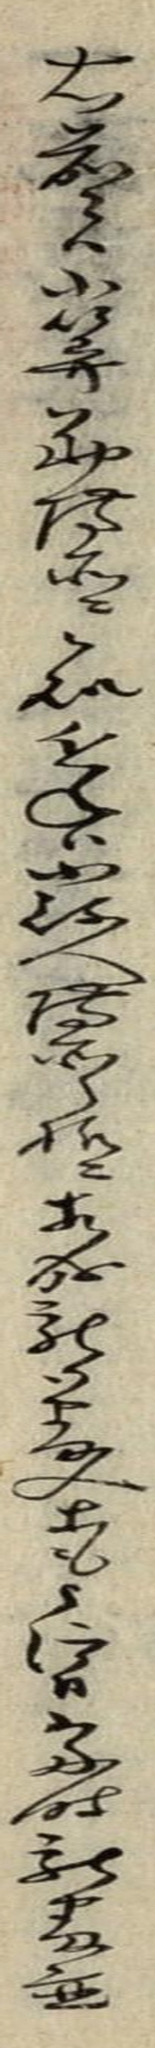右前々は小算勤場所に候処近年は小役人場所之様に相成新御番入等も被仰付当時新番並
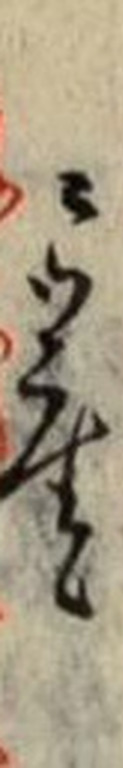に御座候
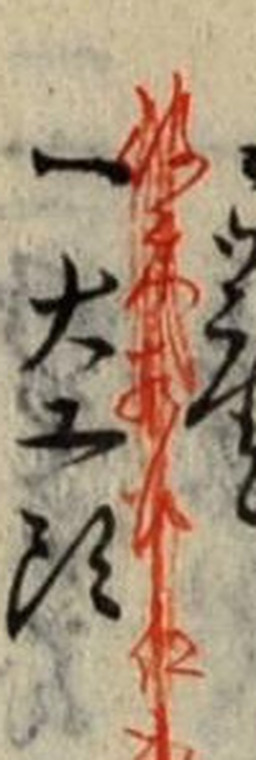一大工頭
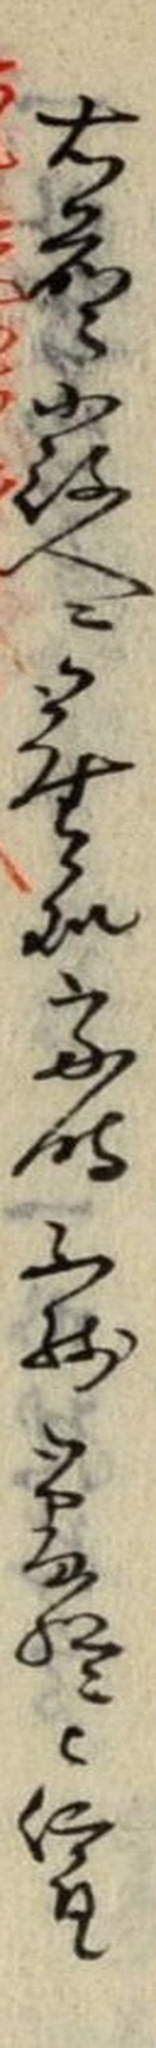右前々小役人に御座候処当時不残御番組に被仰付候
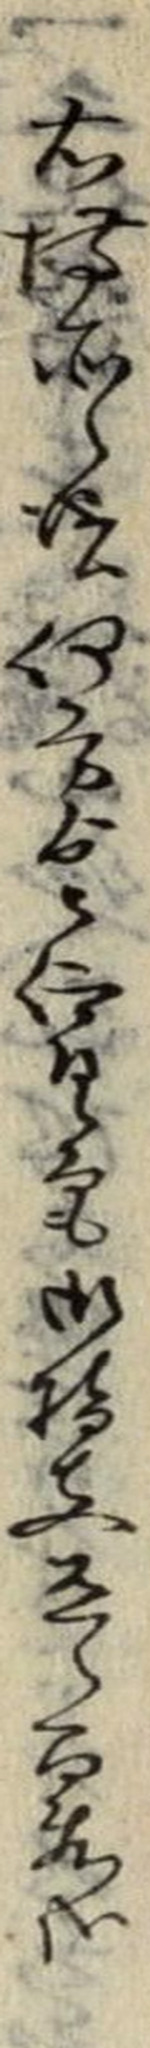右場所之儀は何方ゟ被仰付候而も御指支有之間敷哉
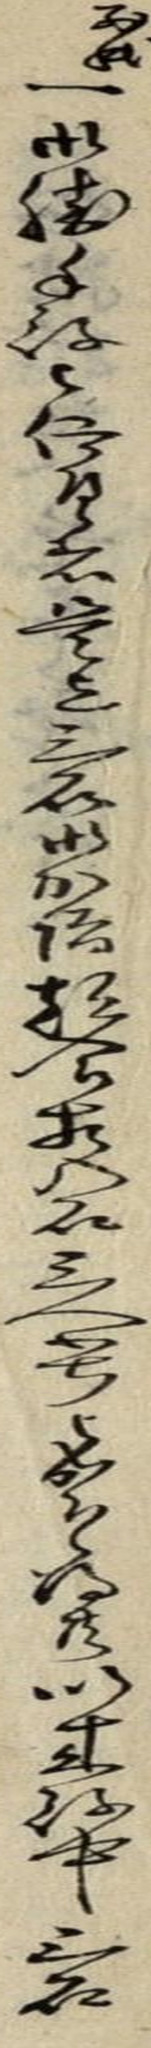一御勝手役被仰付候者是迄三石御加増都合拾八石三人ふち被成下候得共以来役中三石
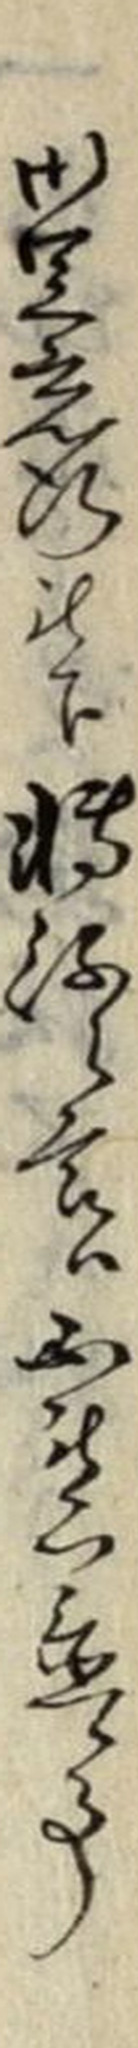御足充行被下転役之節は不被下置候事
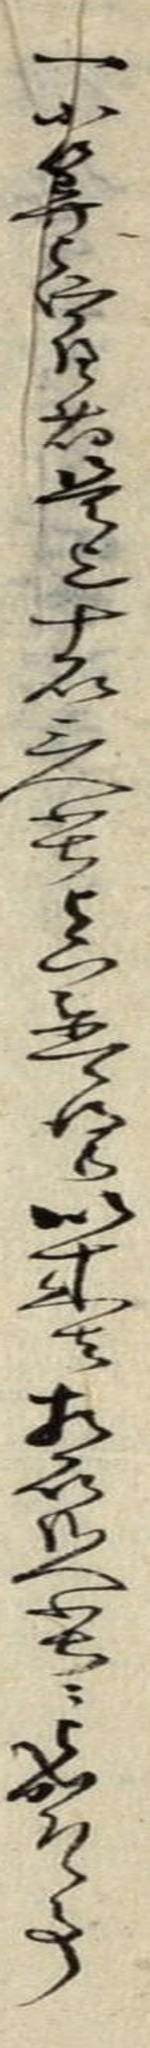一小算被仰付候者是迄十石三人ふち被下置候得共以来は拾石弐人ふちに被成下候事
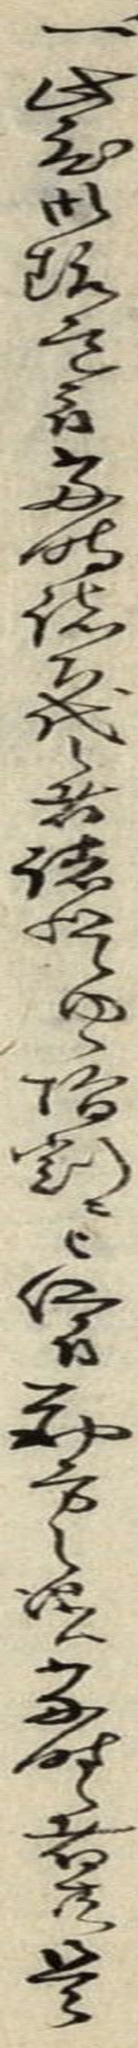一此度御趣意に付当時諸下代之者諸組之内へ増割に被仰付勤方之儀は当時之者共是
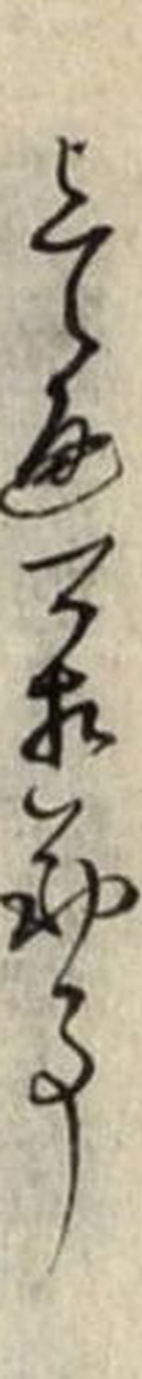迄之通可相勤事
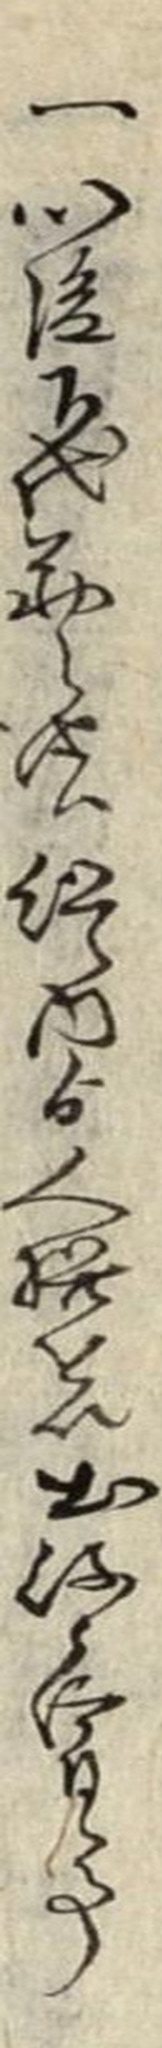一以後下代勤之儀は組之内ゟ人撰を以出役被仰付候事
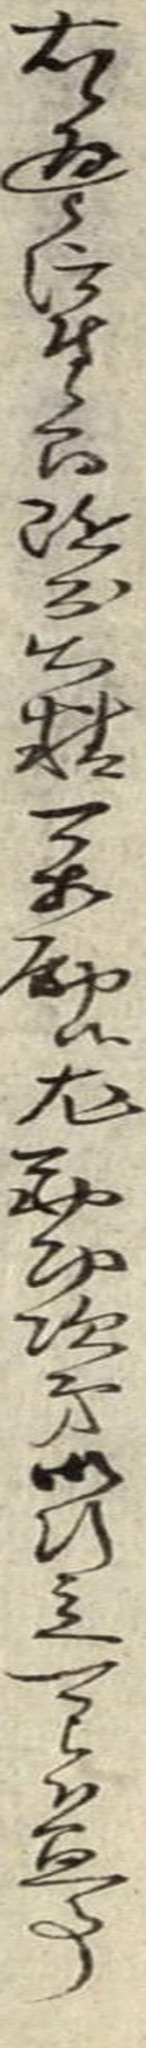右之通被仰付候間随分出精可相勤候尤勤功次第御引立可被下置事
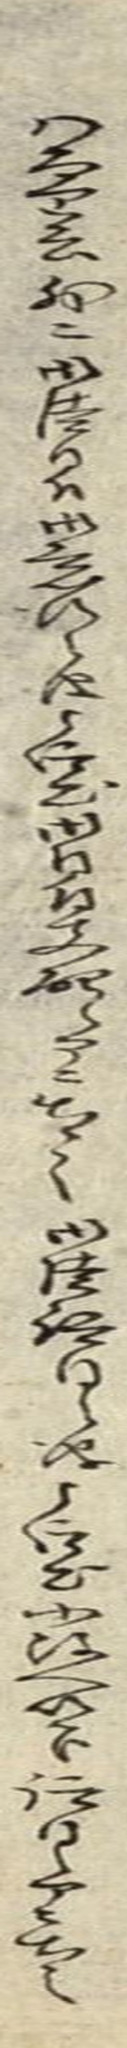八百里云外に御徒目付御充行之儀被仰出御目付支配之部に出之御徒跡目之儀被仰出小役人以下跡目之部に出之
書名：御用并被仰出之部
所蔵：福井県文書館 Fukui Prefectural Archives
